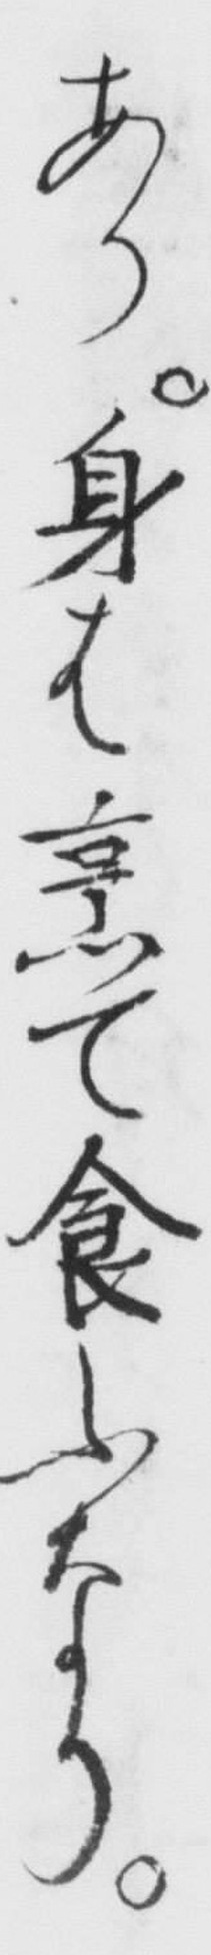あり。身は烹て食ふなり。

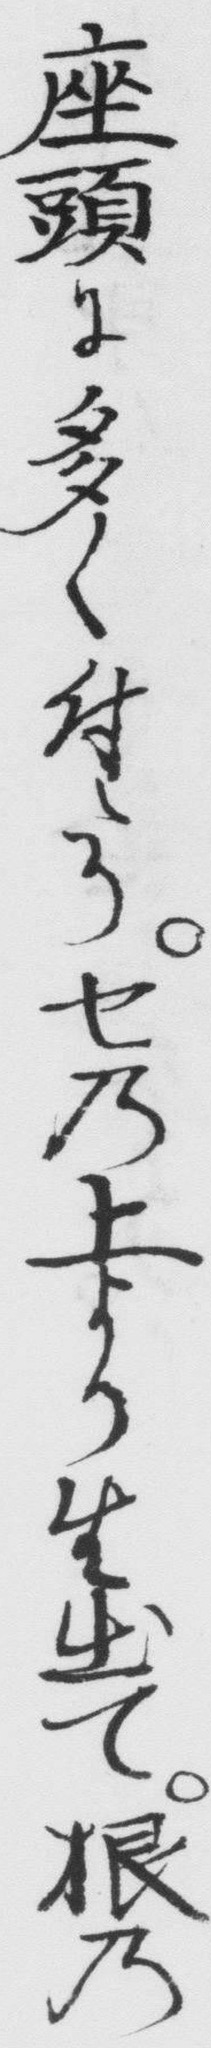牡蠣座頭に多く付たり。セの上より生出て。根の
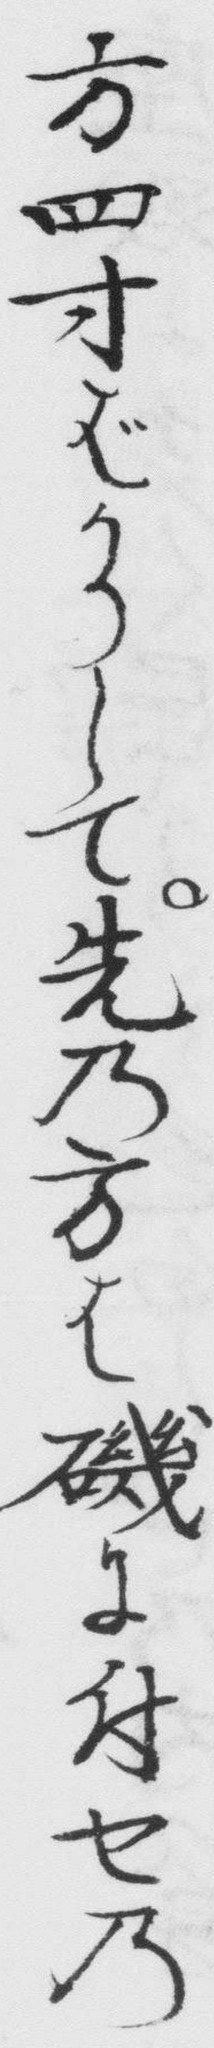方四寸ばかりして。先の方は磯に付セの
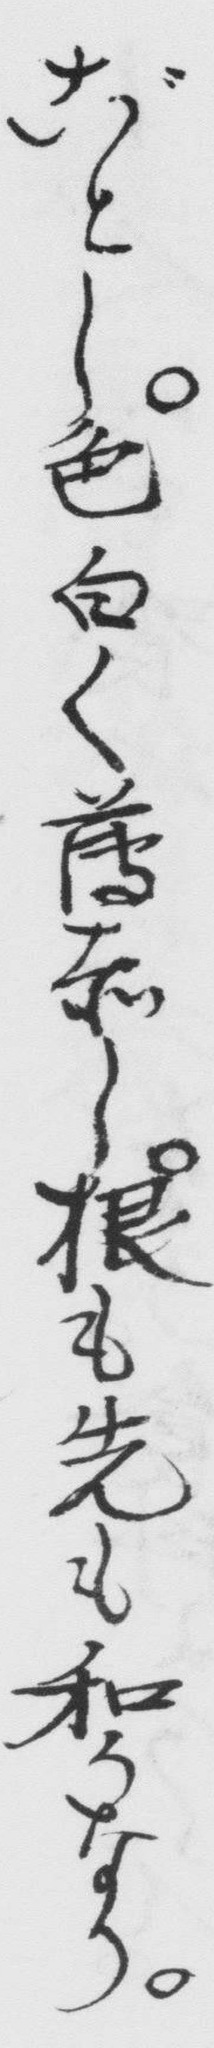ごとし。色白く薄赤し。根も先も和かなり。
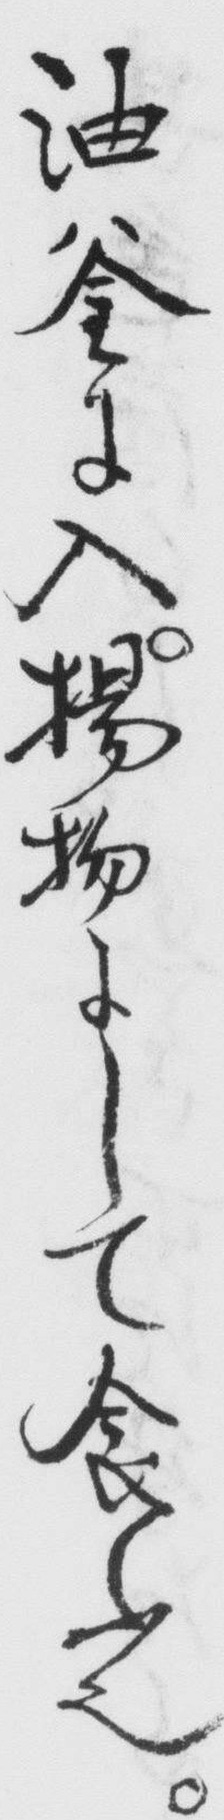油釜に入。揚物にして食ふ也。
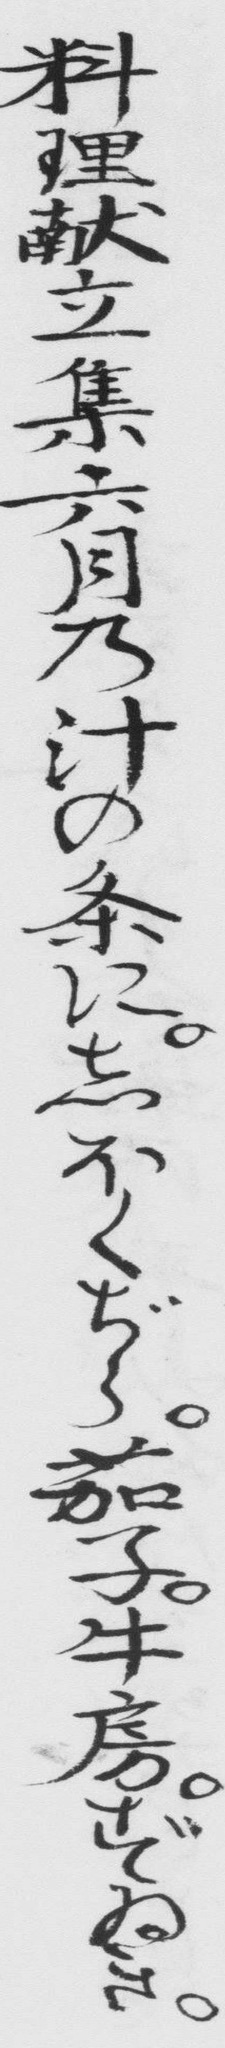料理献立集六月の汁の条に。しほくぢら。茄子。牛房。ずゐき。
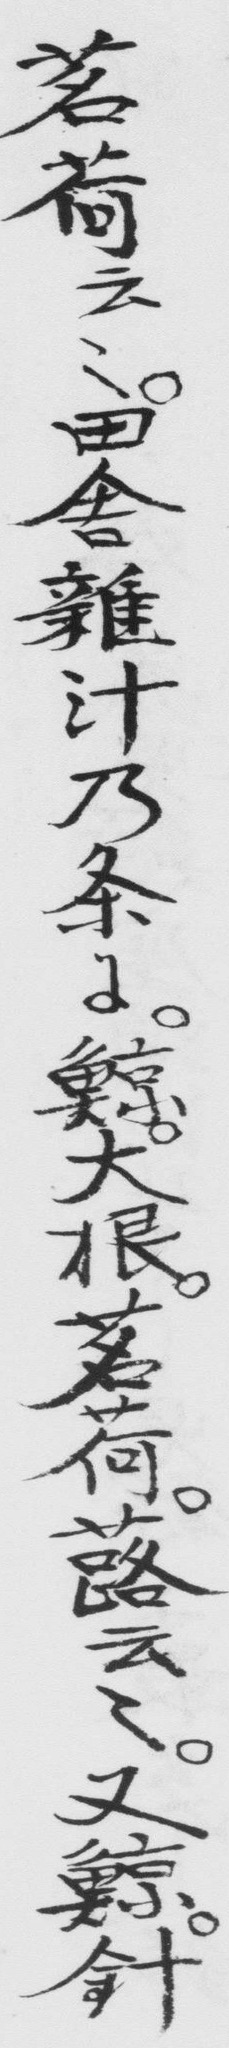茗荷云々。田舎雑汁の条に。鯨。大根。茗荷。蕗云々。又鯨。針
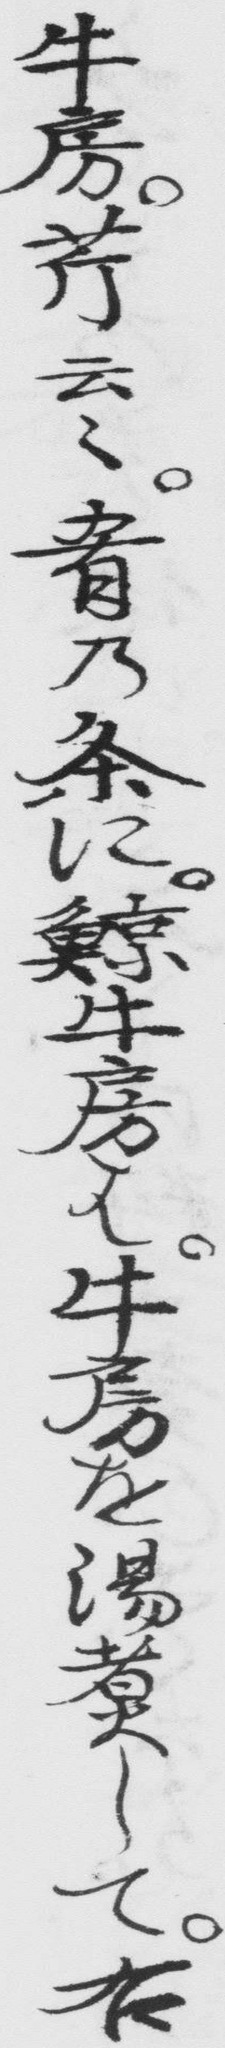牛房。芹云々。肴の条に。鯨牛房は。牛房を湯煮して。右
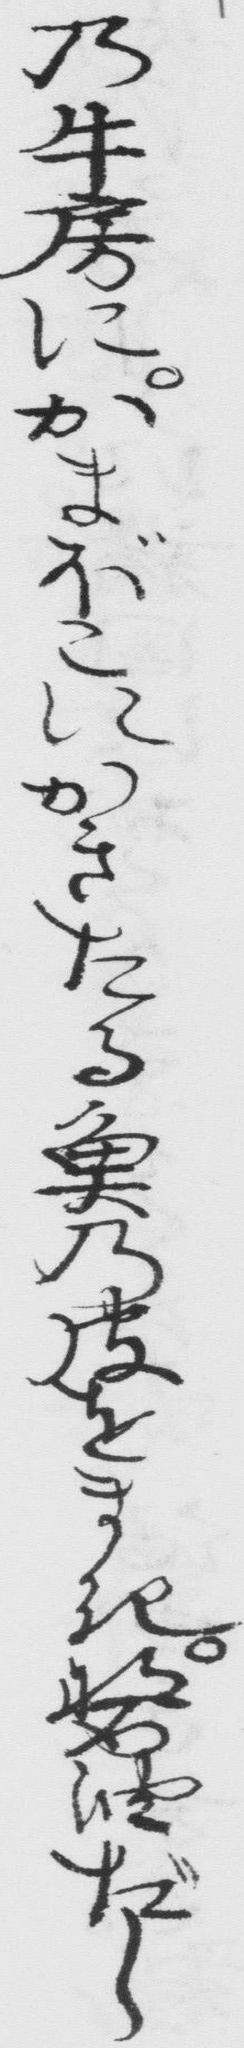の牛房に。かまぼこにかきたる魚の皮をまき。醤油だし
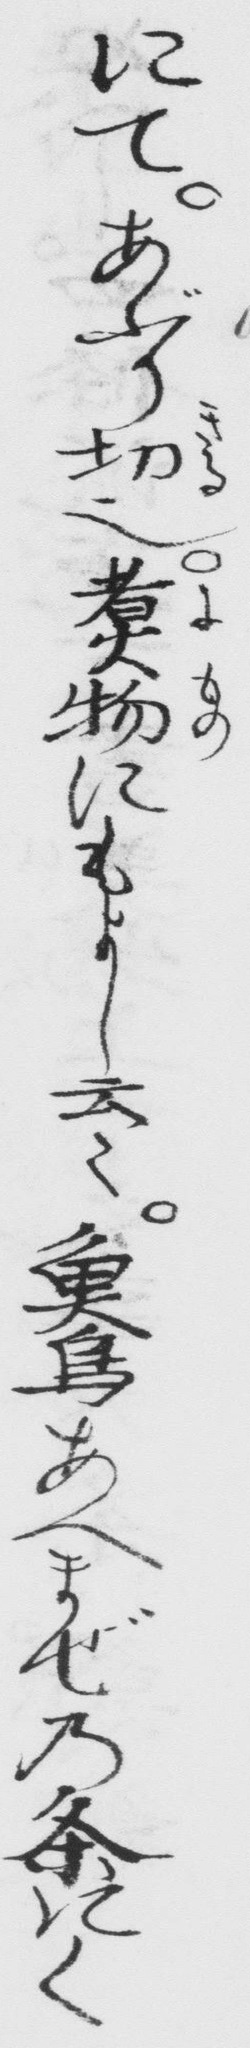にて。あぶり切也。煮物にもよし云々。魚鳥あへまぜの条にく
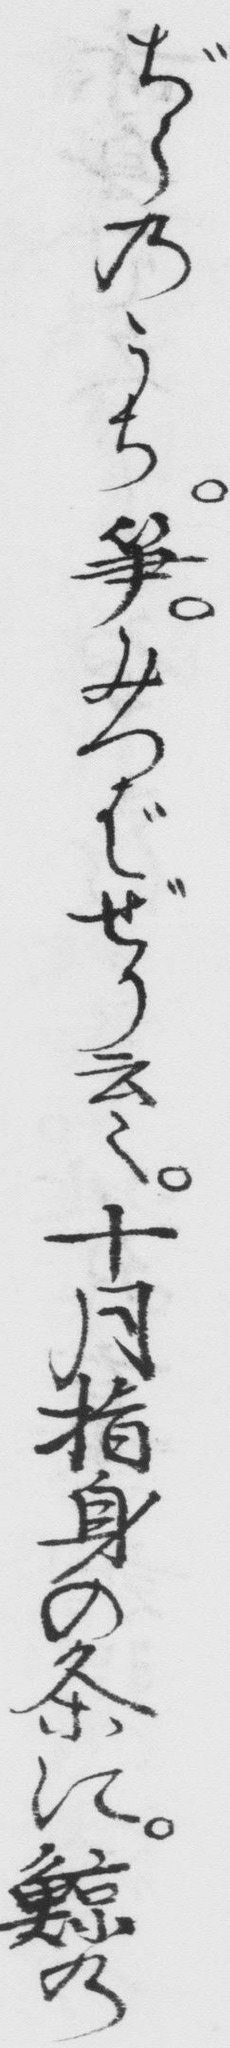ぢらのうち。笋。みつばぜり云々。十月指身の条に。鯨の
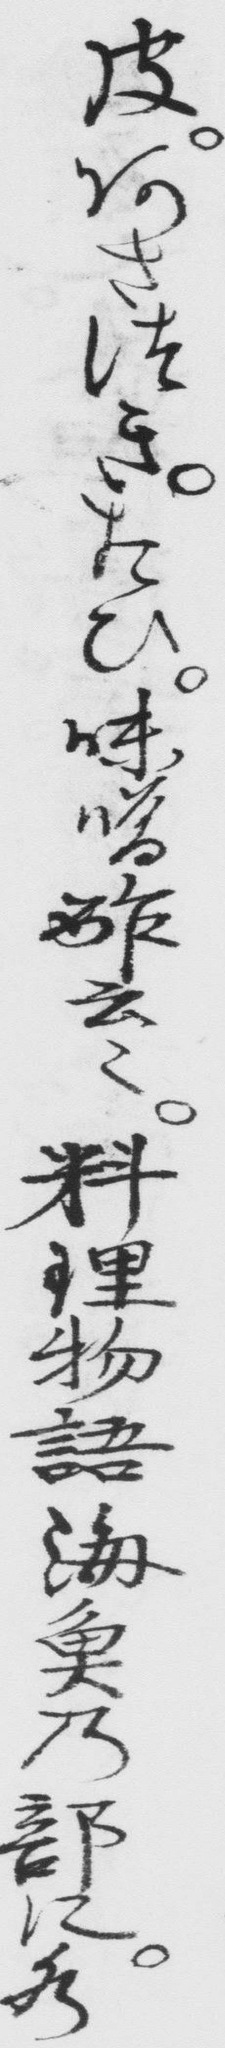皮。あさつき。たひ。味噌酢云々。料理物語海魚の部に。水
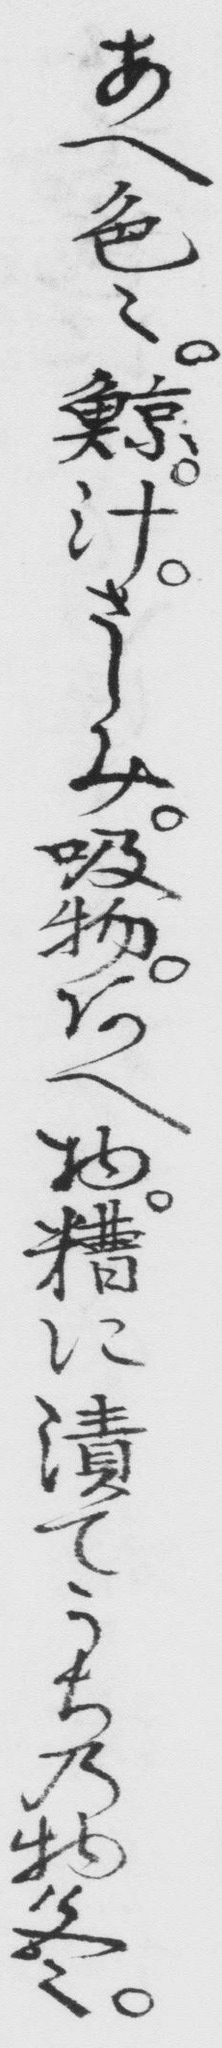あへ色々。鯨汁。さしみ。吸物。あへ物。糟に漬てうちの物色々。
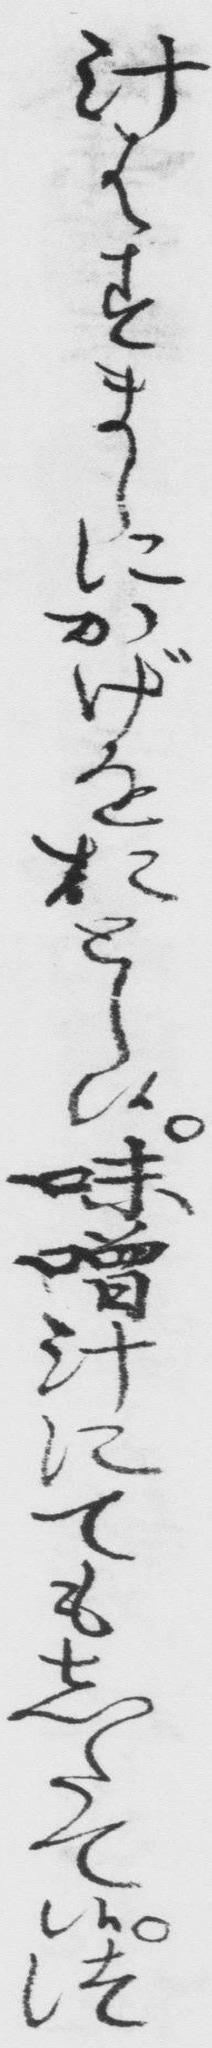汁はすましにかげをおとし候。味噌汁にてもしたて候。つ
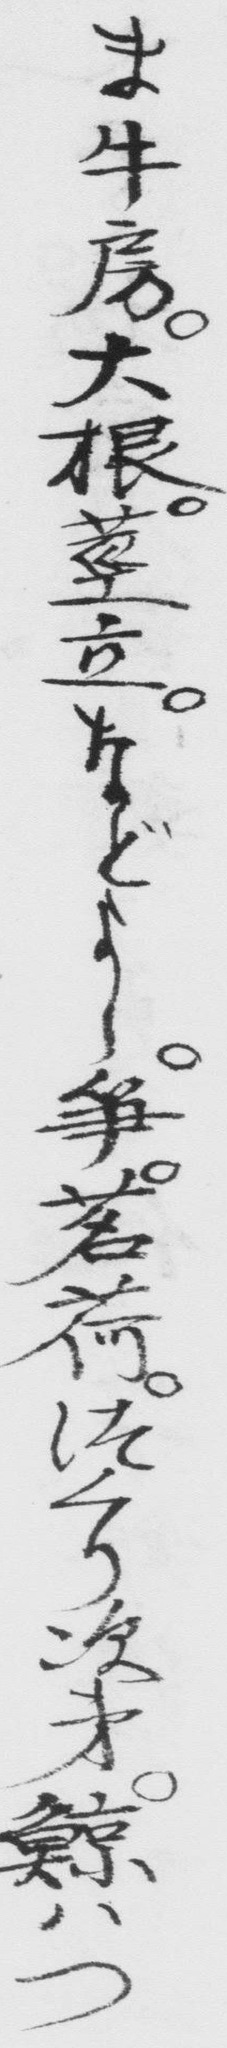ま牛房。大根。茎立。などよし。笋。茗荷。つくり次第。鯨はつ
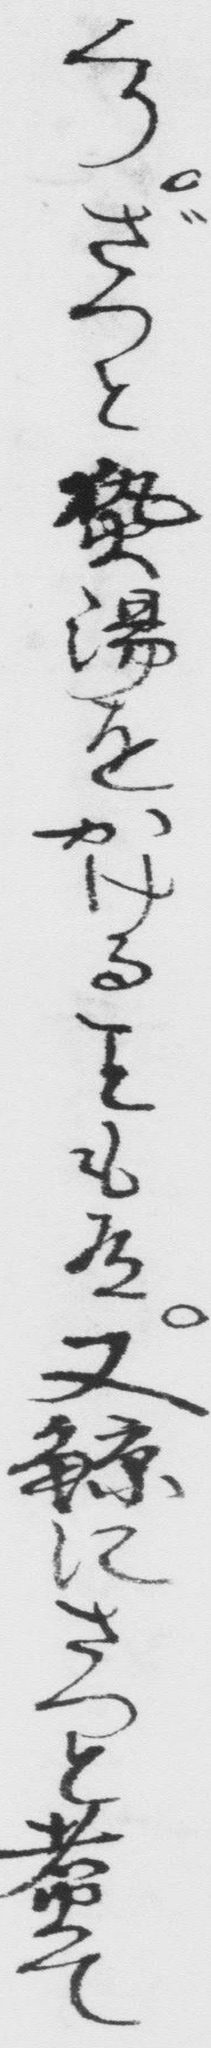くり。ざつと熱湯をかけることも有。又鯨にさつと煮て
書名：鯨肉調味方
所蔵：大阪府立大学学術情報センター 国文学研究資料館
